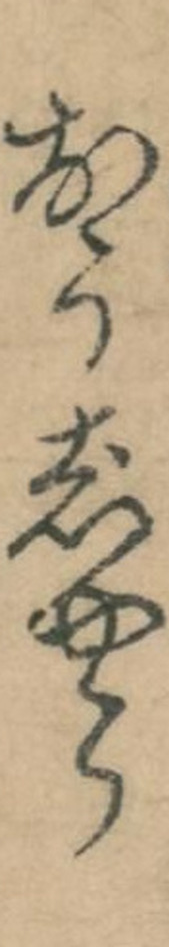おうじやう
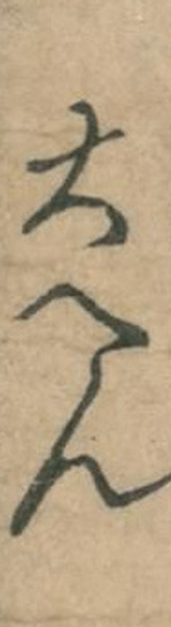大へん
